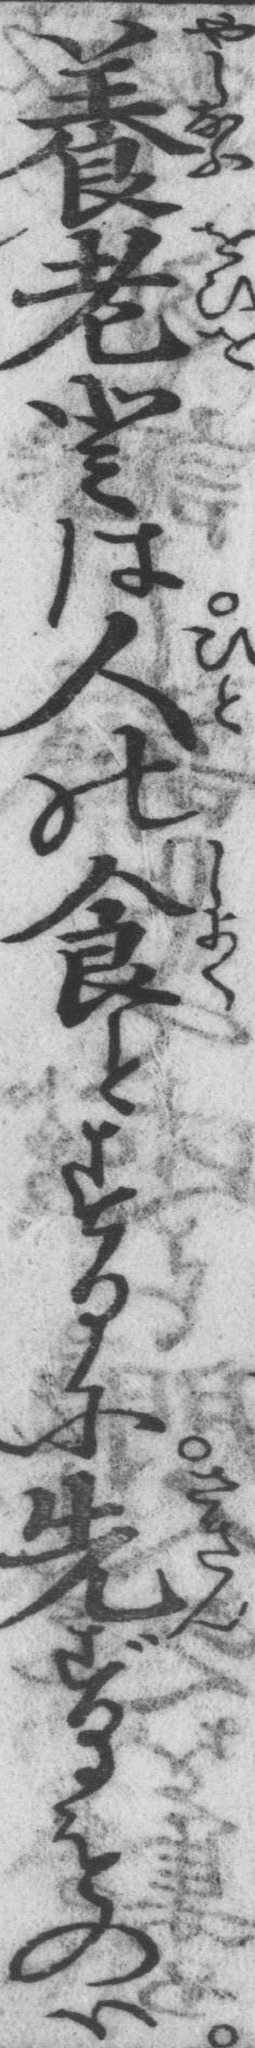養老とは。人の食とするに。先ずるものは。
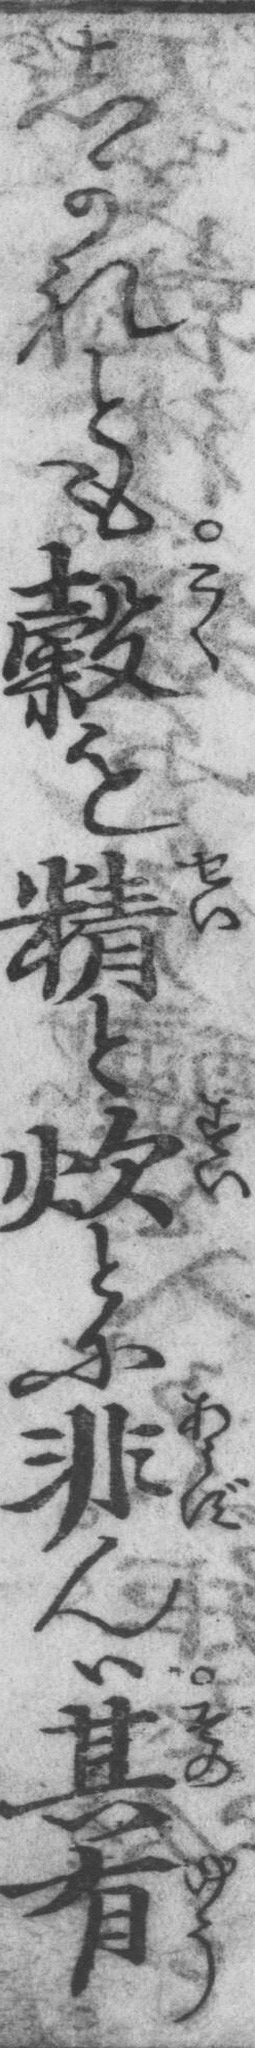しかれとも。穀を精と炊とに非んは。其有

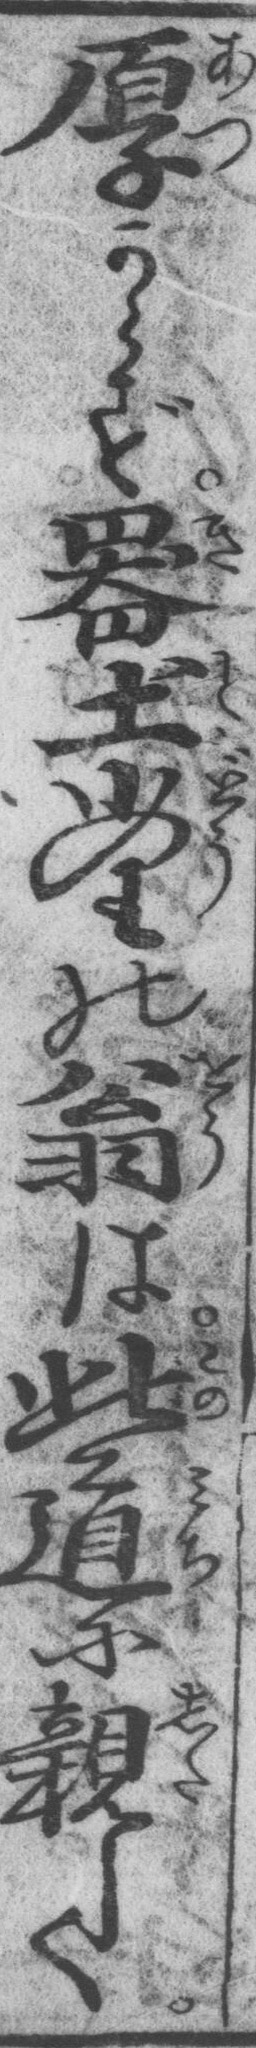厚からず。器土堂の翁は。此道に親しく。
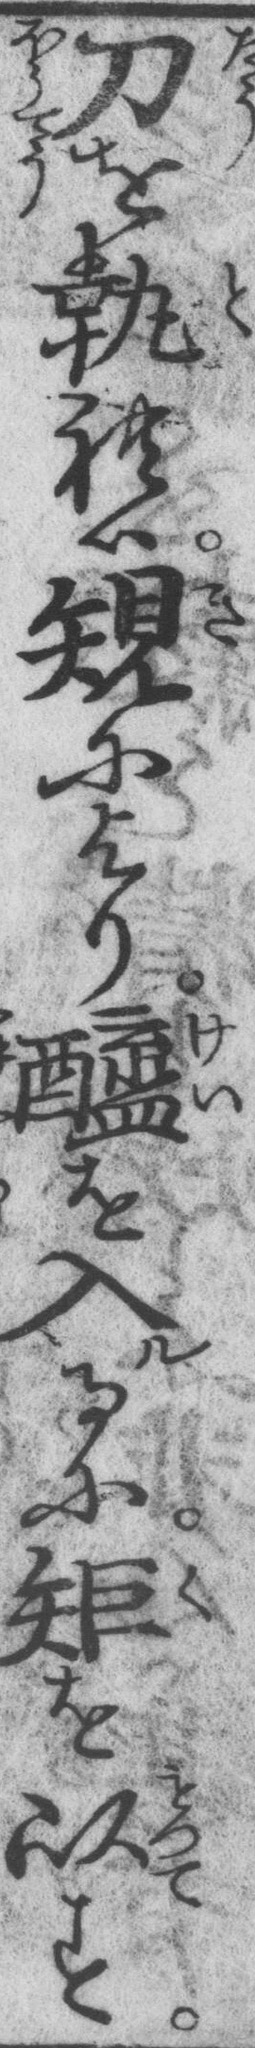刀を執れは。規により。醯入ルるに。矩を以す。
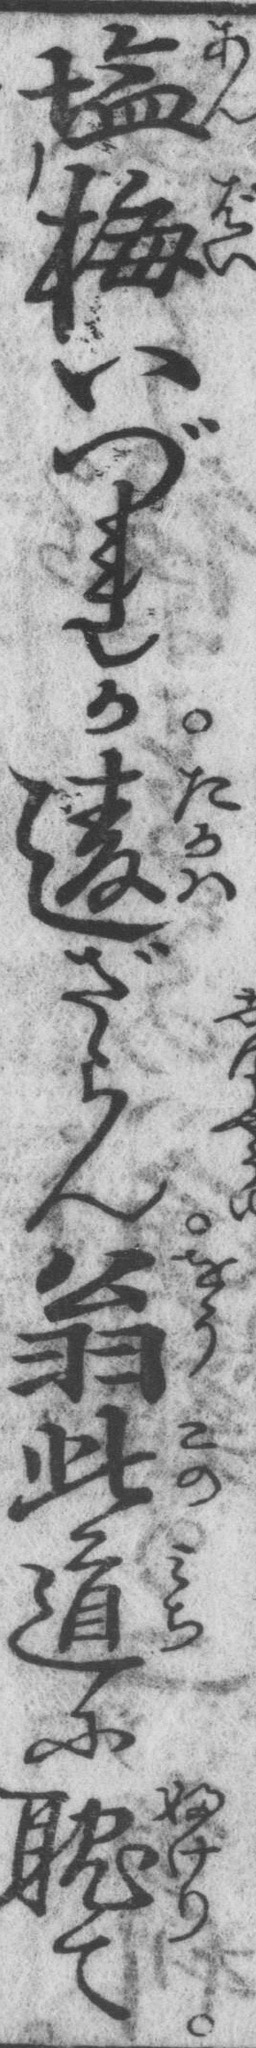塩梅いづれか。違ざらん。翁此道に耽て。
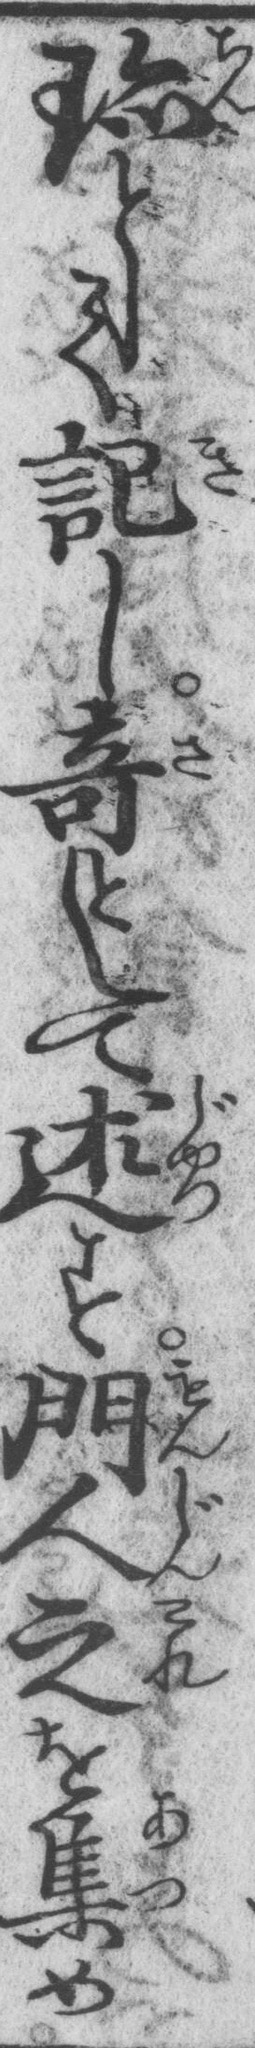珎として記し。奇として述す。門人之を集め
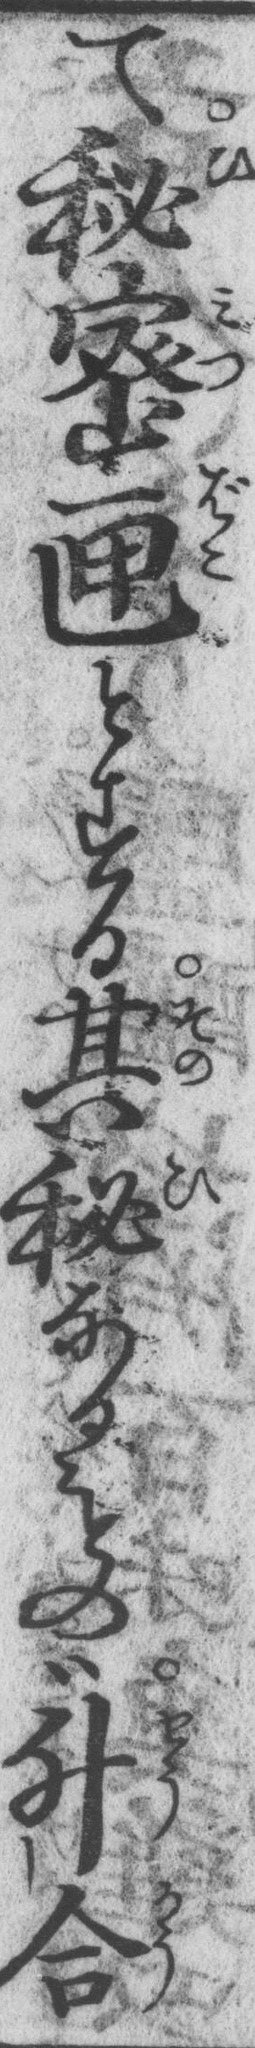て。秘密匣とする。其秘なるものは。升合
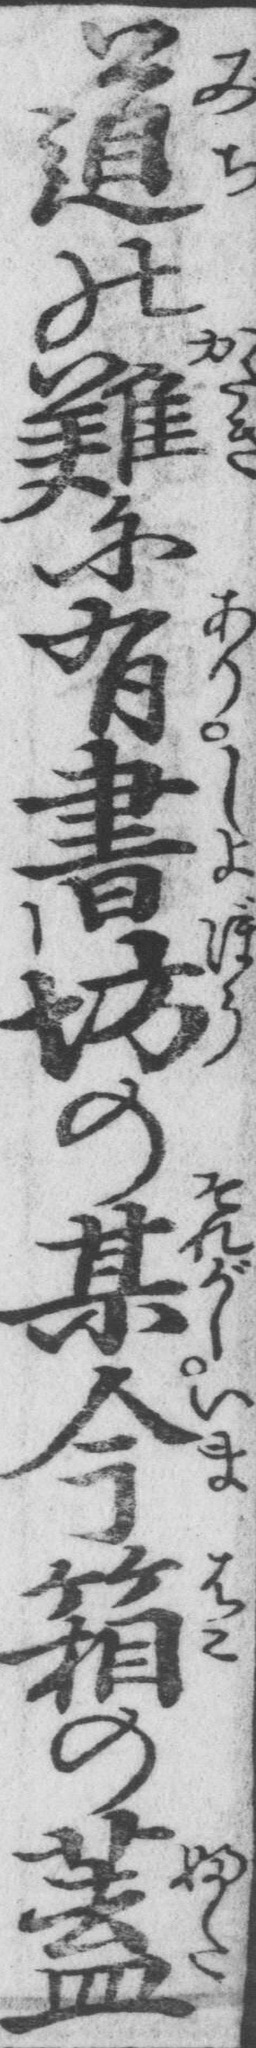道の難に有。書房の某。今箱の蓋
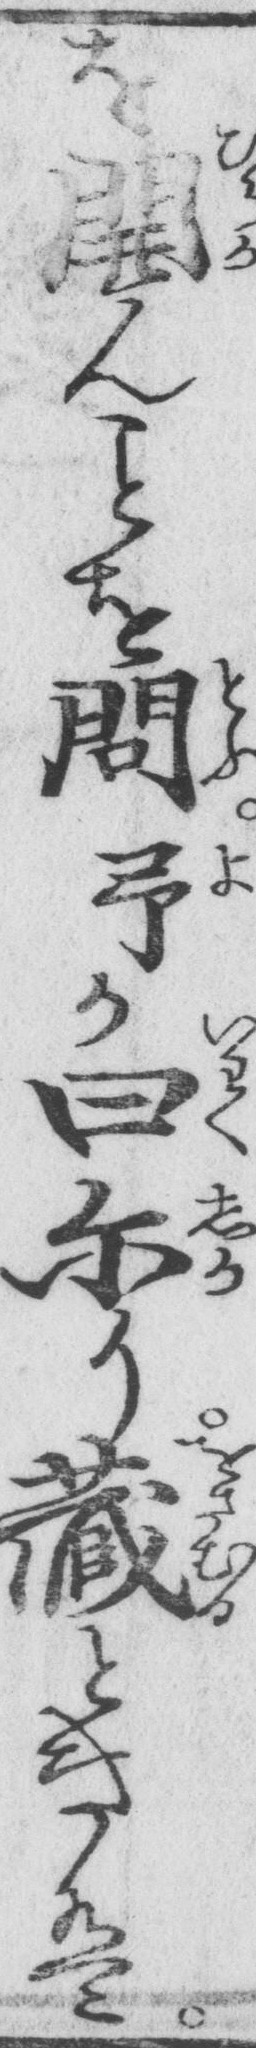を開んことを問。予か曰爾り。蔵ときは
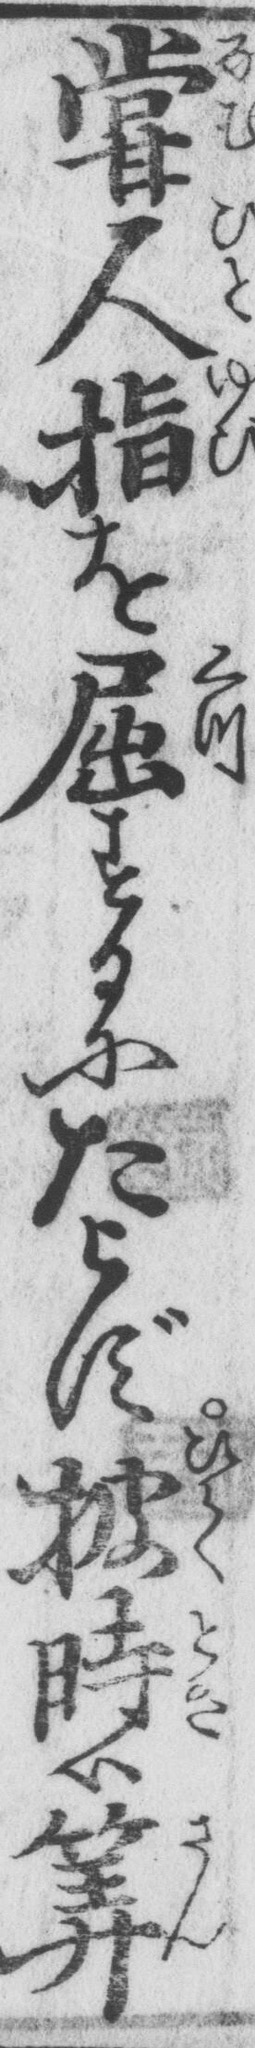甞人指を屈するにたらず。披時は筭
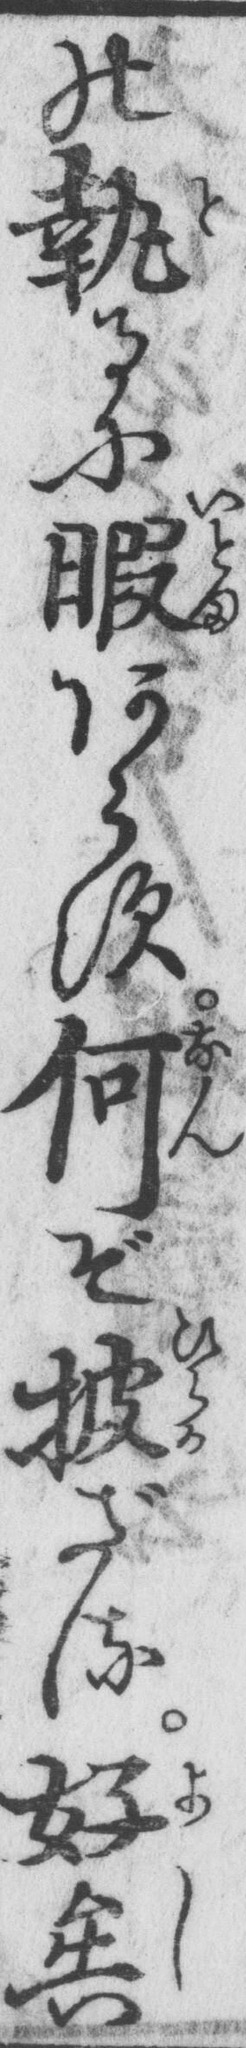の執るに暇あらす。何ぞ披ざる。好矣
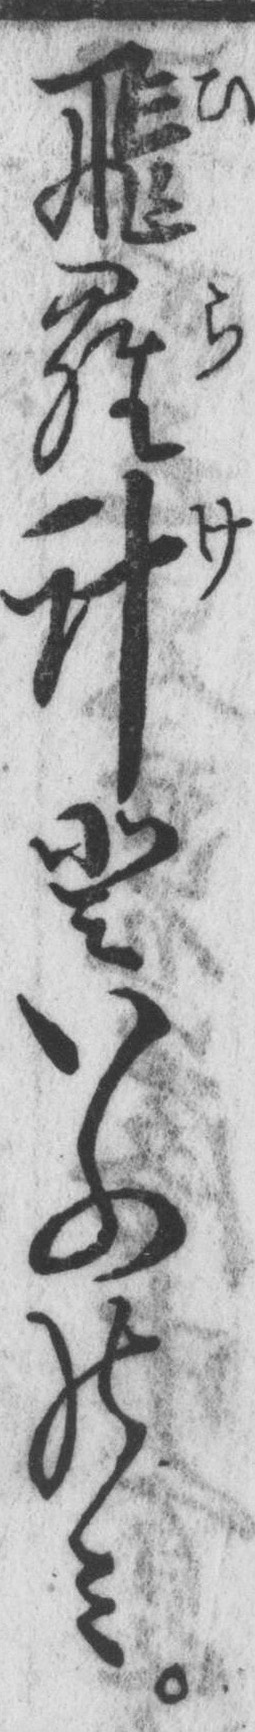飛羅計といふのみ。

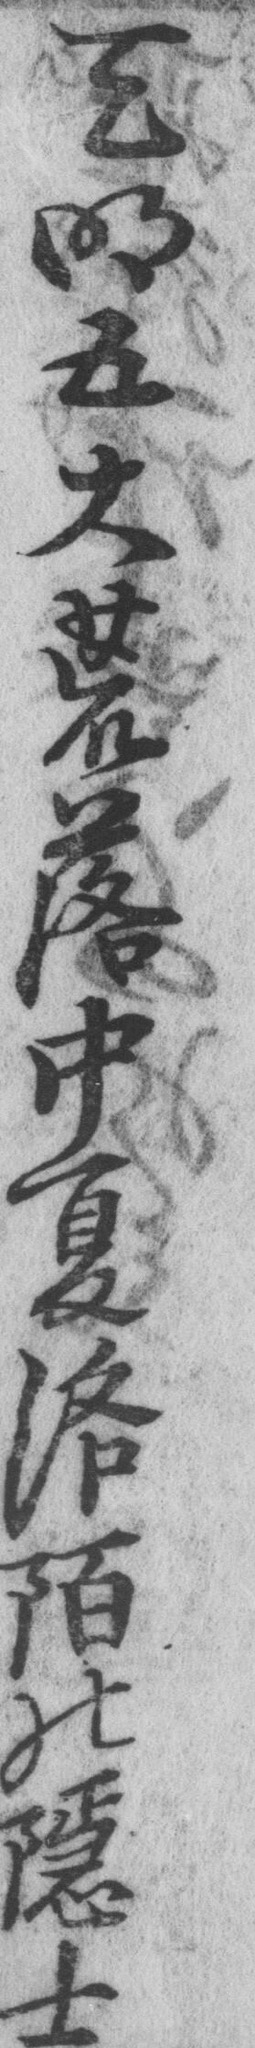天明五大荒落中夏洛百の隠士
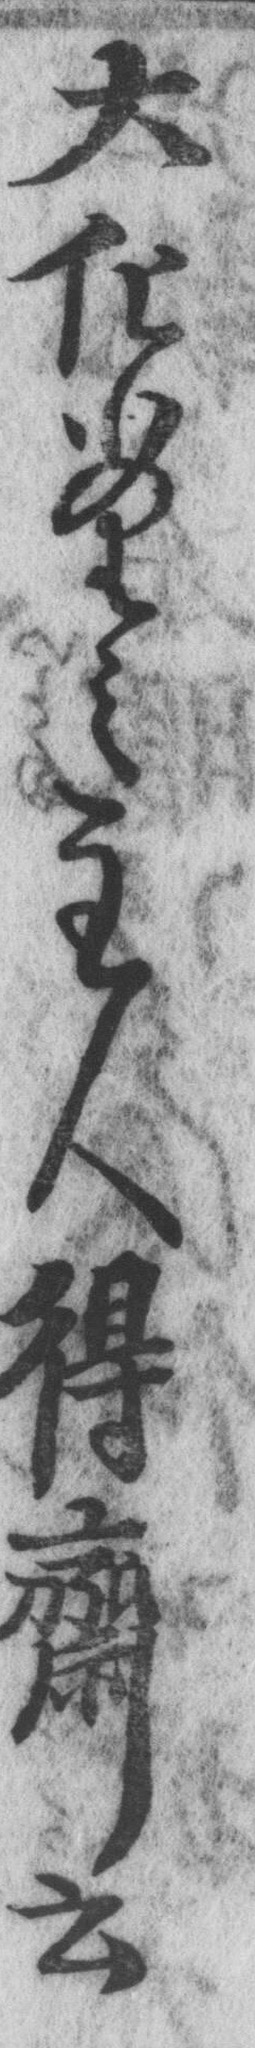大化堂の主人得斎云
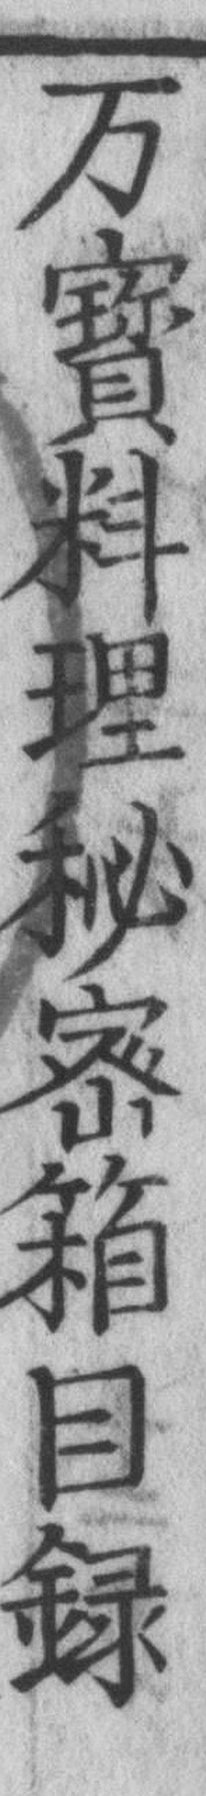万宝料理秘密箱目録
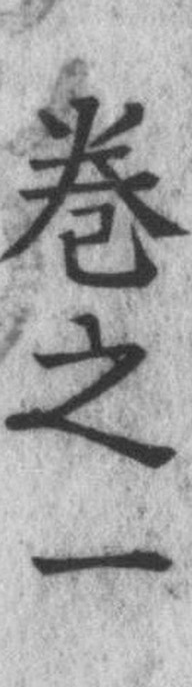巻之一
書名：萬寳料理秘密箱
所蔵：大阪府立大学学術情報センター 国文学研究資料館
